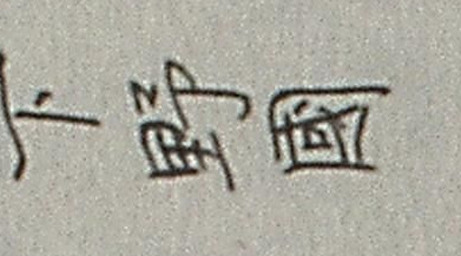下野国
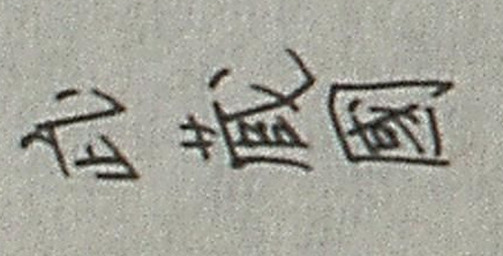武蔵国
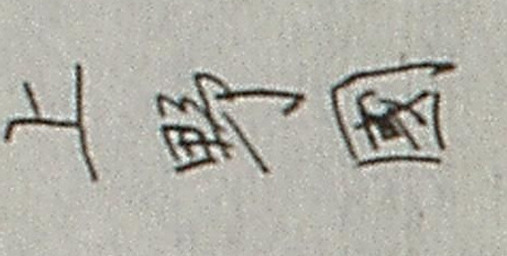上野国
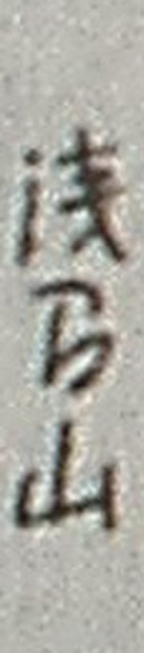浅間山
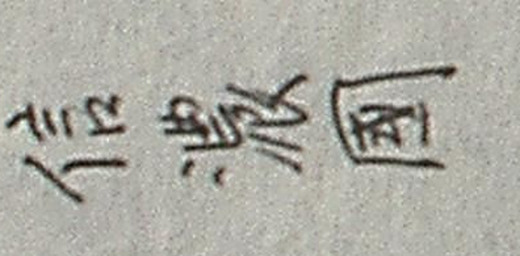信濃国

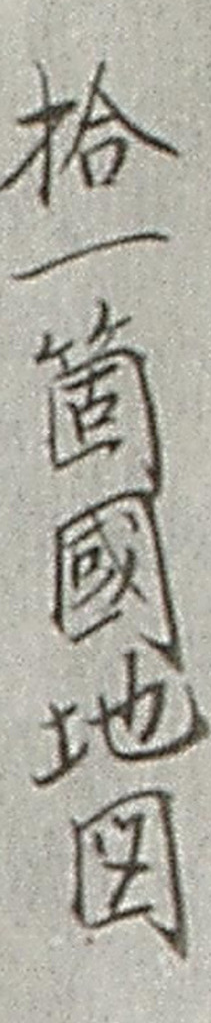拾一箇国地図

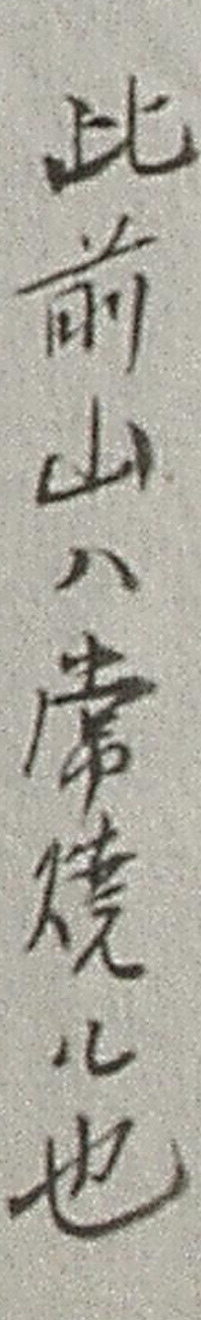此前山は常焼ル也
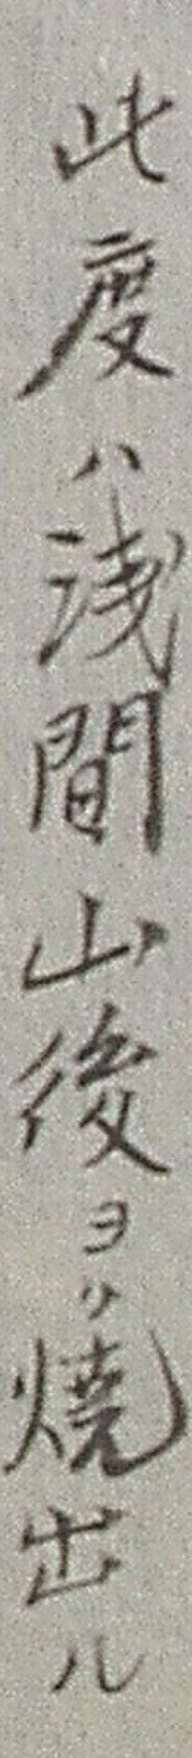此度は浅間山後ヨリ焼出ル
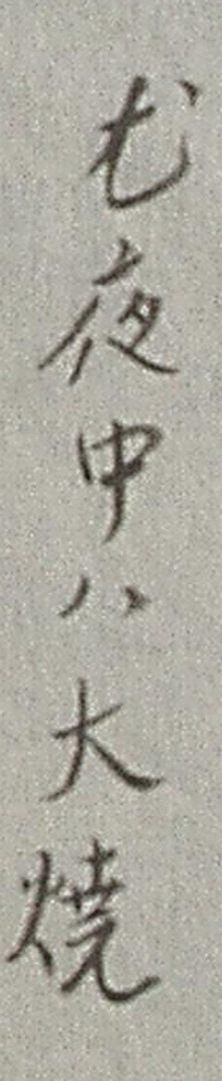尤夜中は大焼
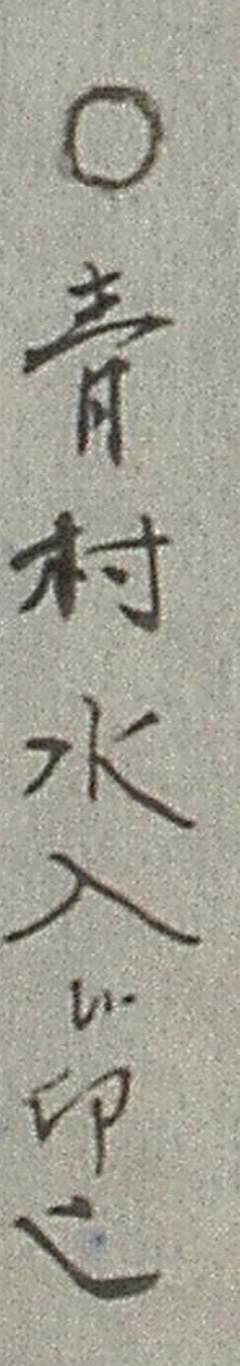○青村水入候印也
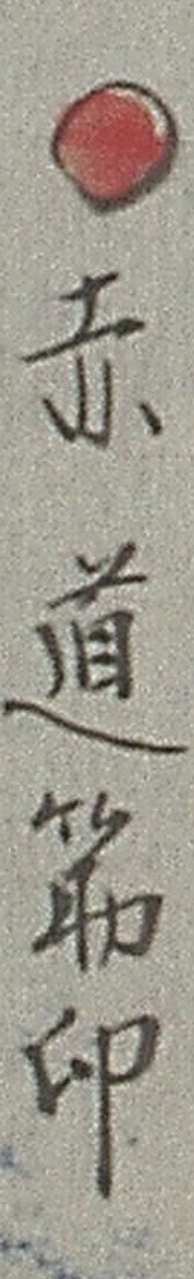○赤道筋印
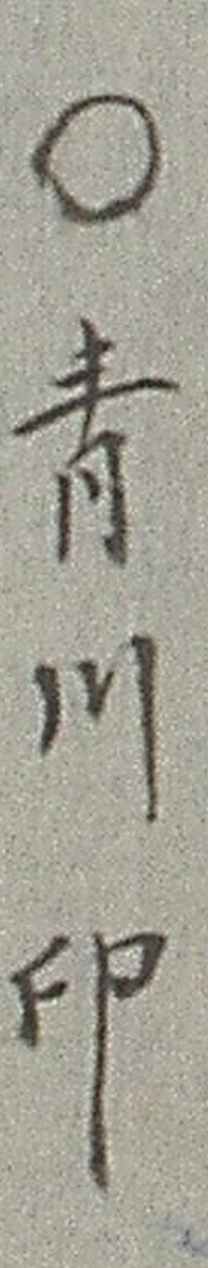○青川印
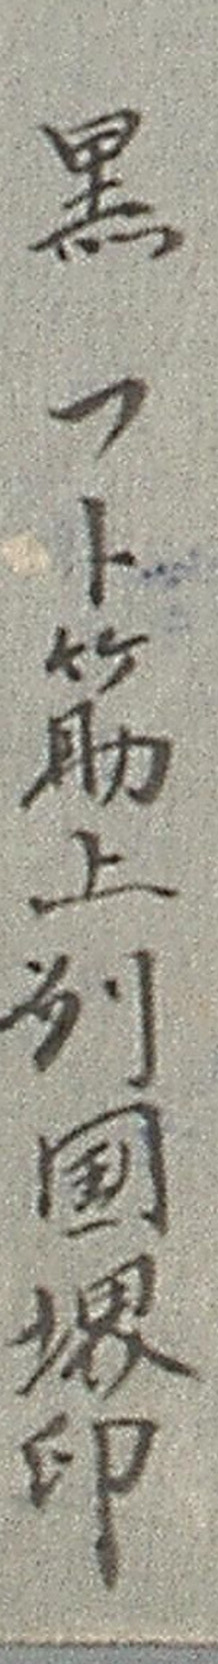黒フト筋上列国堺印

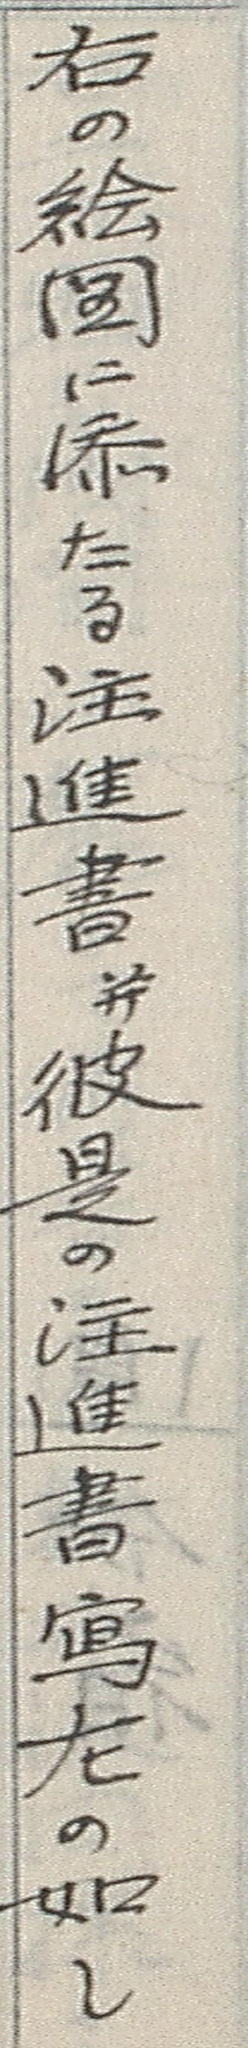右の絵図に添たる注進書并彼是の注進書寫左の如し
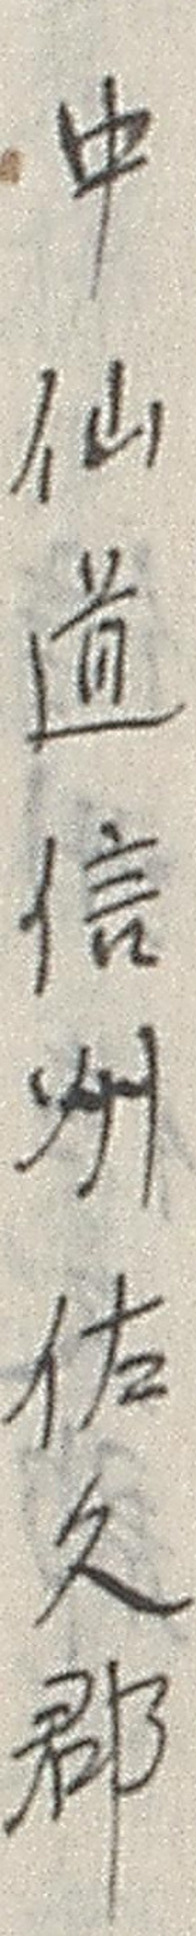中仙道信州佐久郡
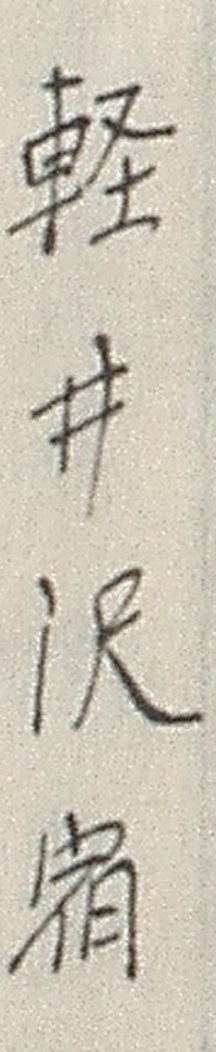軽井沢宿
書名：浅間山焼出記
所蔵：東京大学地震研究所図書室 Earthquake Research Institute Library, The University of Tokyo, JAPAN
